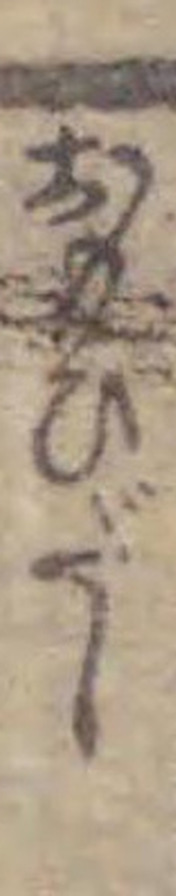おもひだし
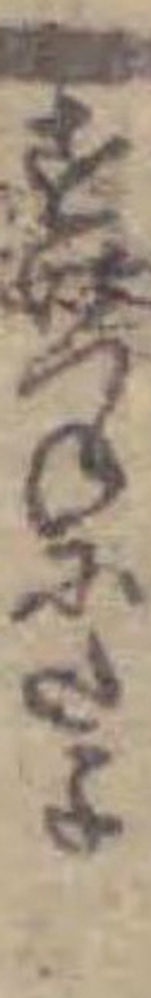すけつねにたよ
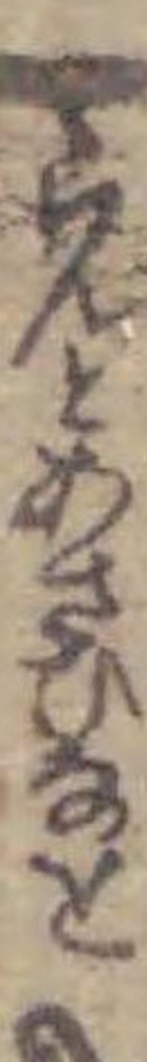らんとあさひなを
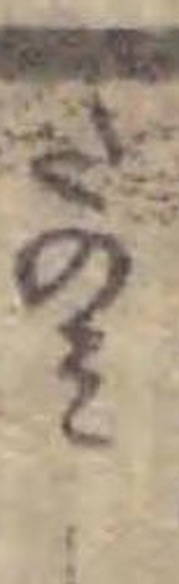たのみ
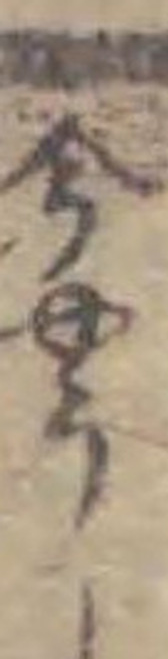今やう
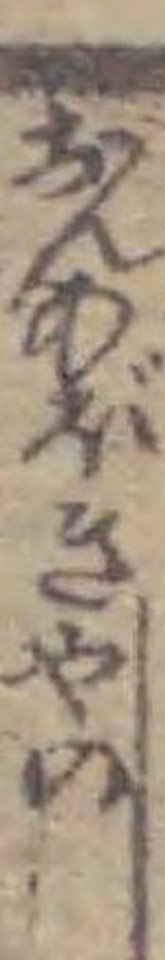おんあぼきやの
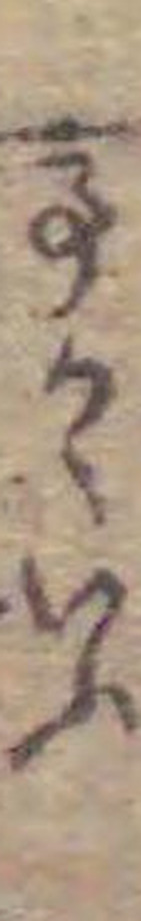事かくいふ
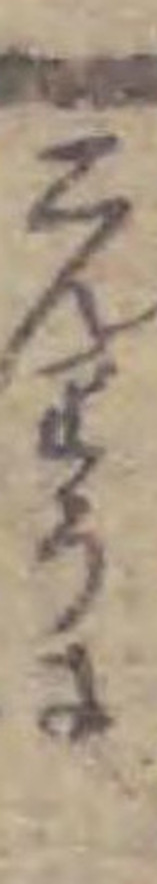こんりうに
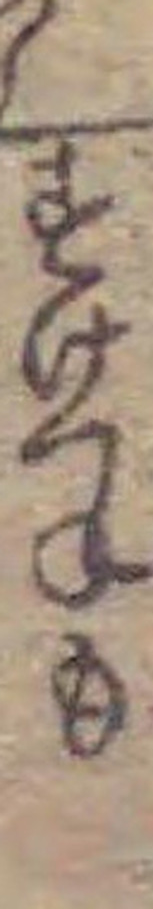すけつねも
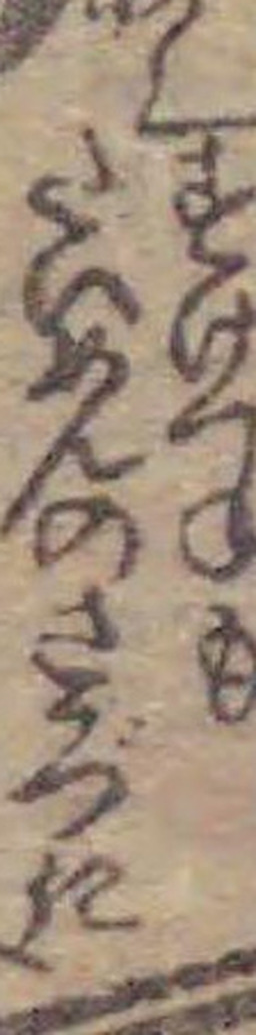たいめんのさかづき
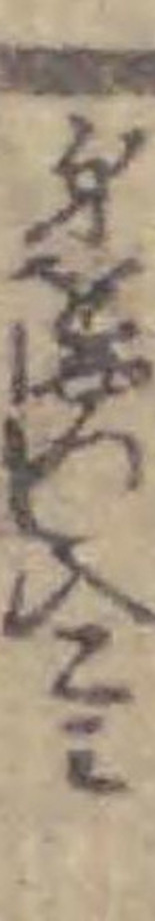身をやつし入こみ
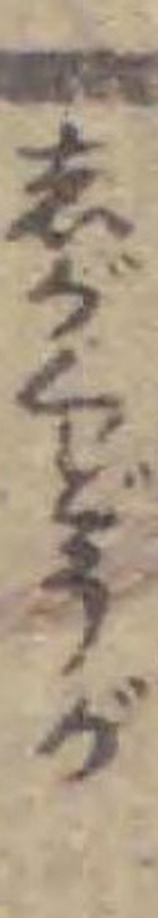しがくどうが
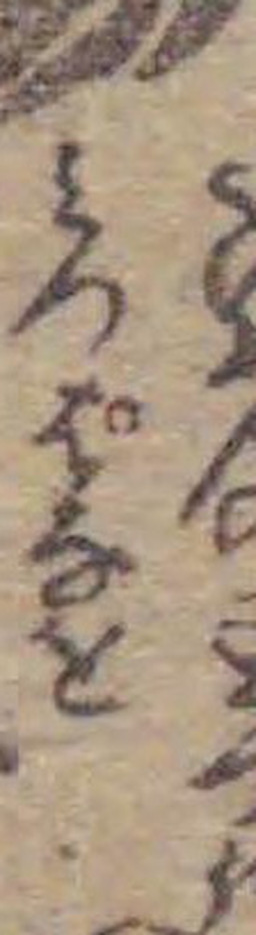みつぱなを
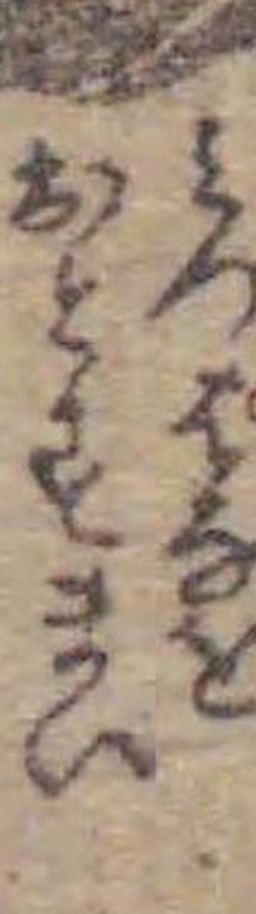おとすまい
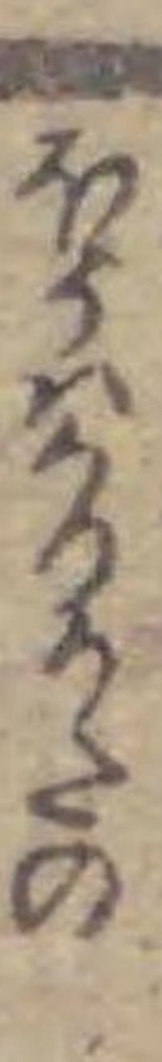ほうはかりかたの
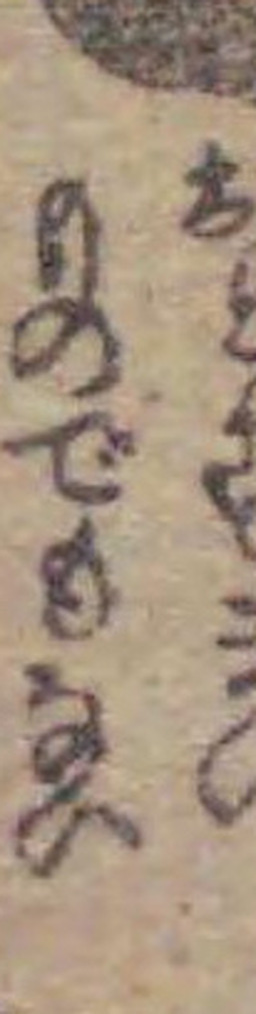ものでもない
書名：年寄之冷水曽我 : 3巻
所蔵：国立国会図書館 National Diet Library, JAPAN
